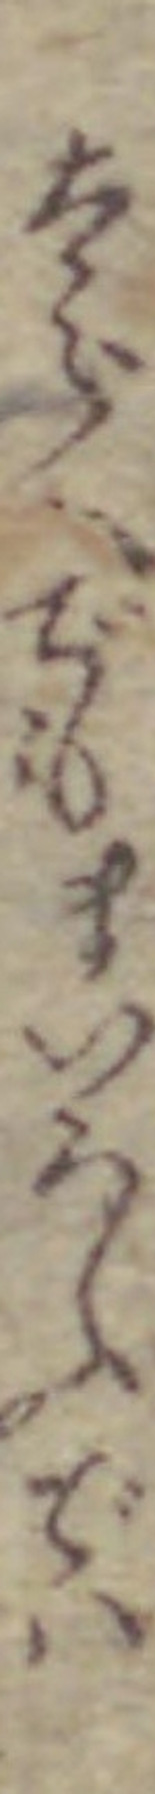太郎へでもまいろふでは
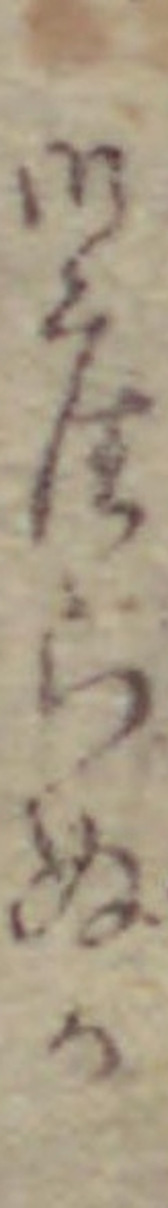御座らぬか
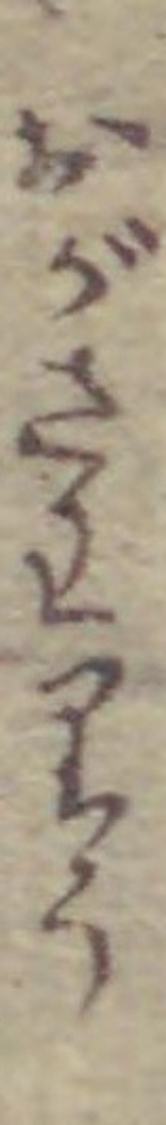おがさわりう
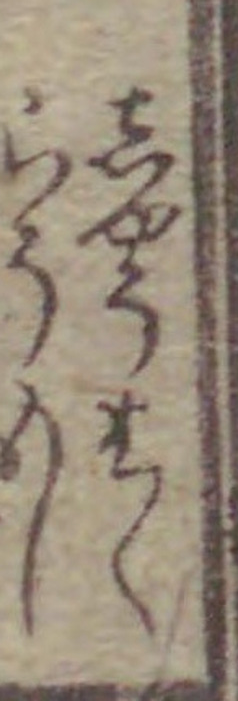しやうはく
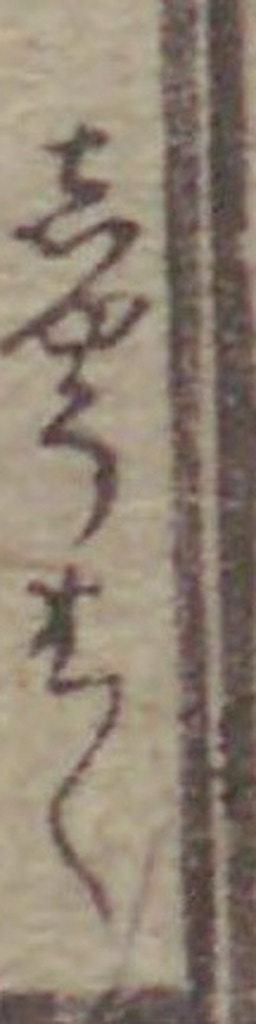しやうはく
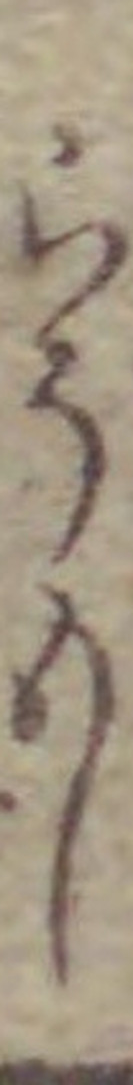らうもし
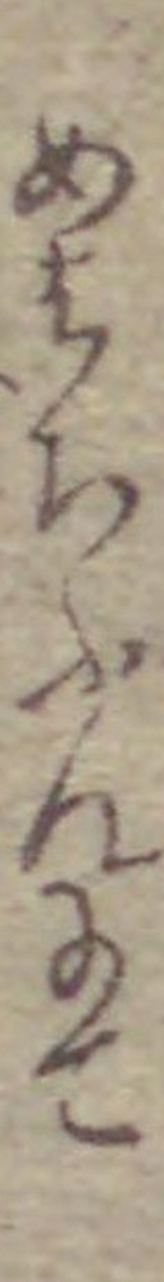めはちふんにて
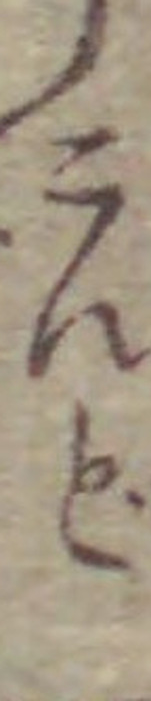こんど
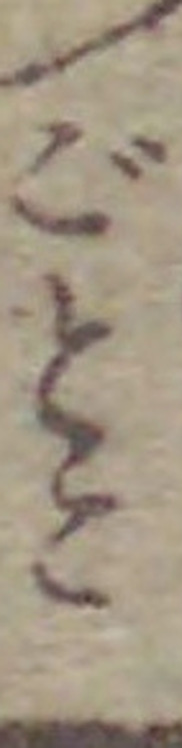ごとこ
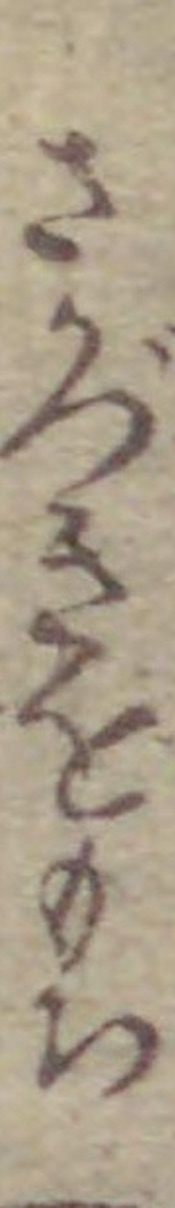さかづきをもち
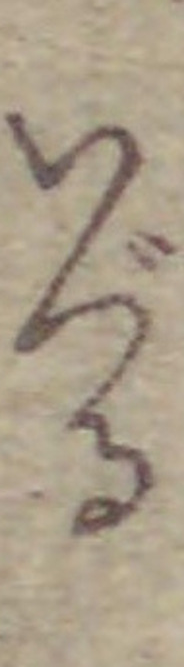いづる

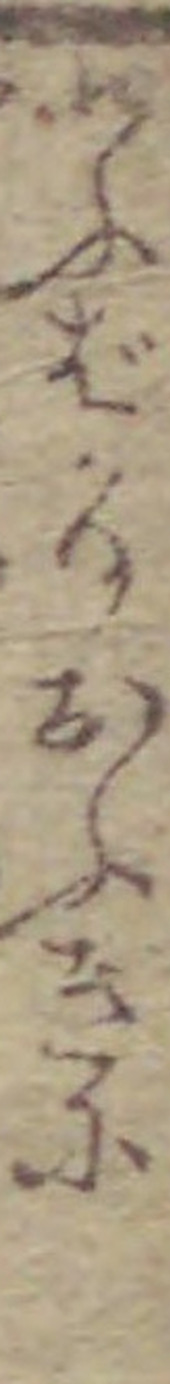けふばかりおふきに
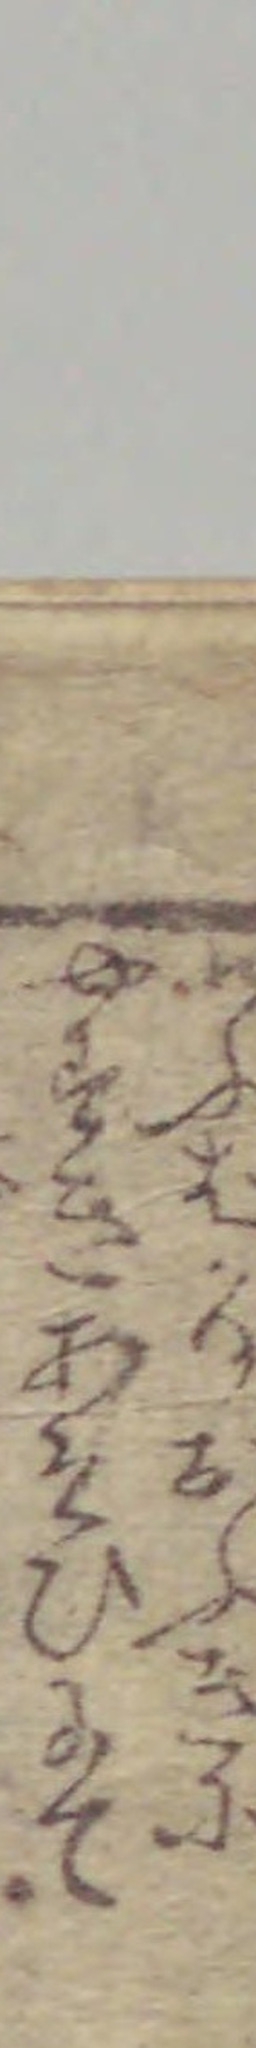やすきあそひにて
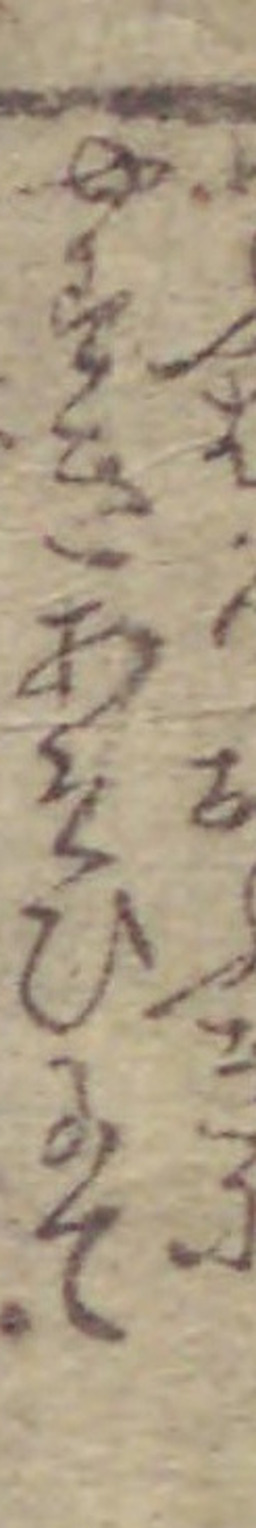やすきあそひにて
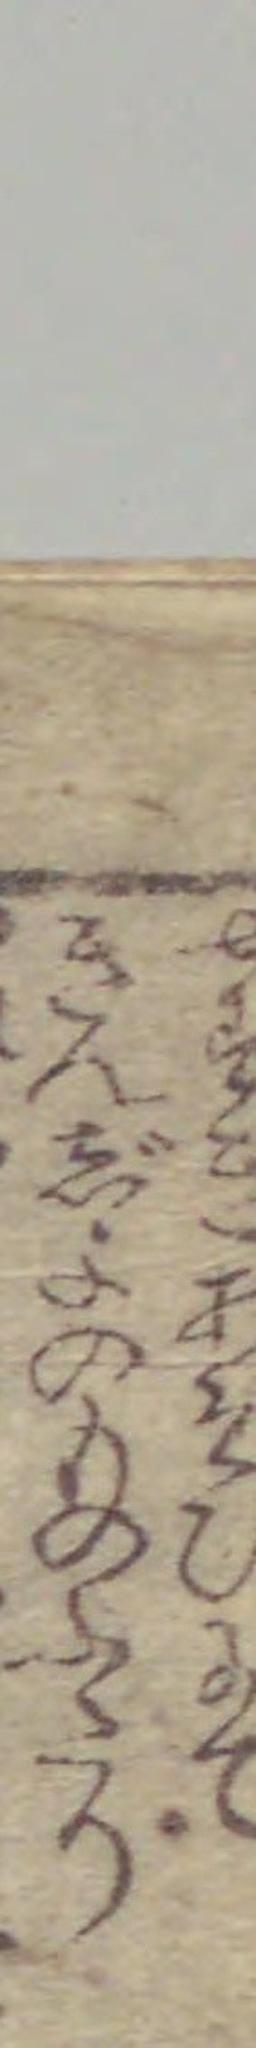きんじよのものふたり
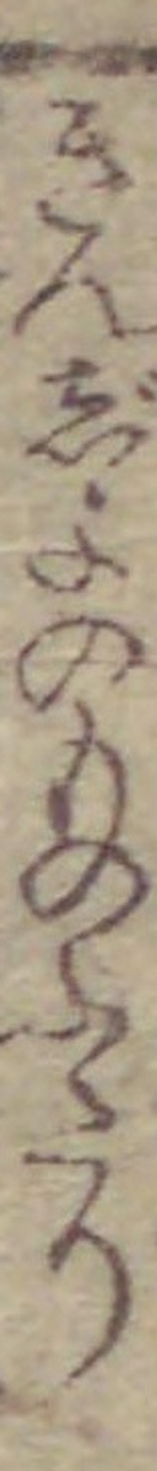きんじよのものふたり
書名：親父布子鳶握 3巻
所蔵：国立国会図書館 National Diet Library, JAPAN
